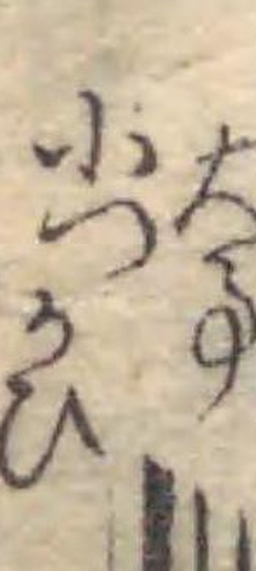小つかひ
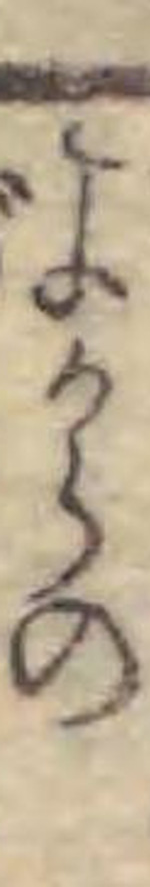よからの
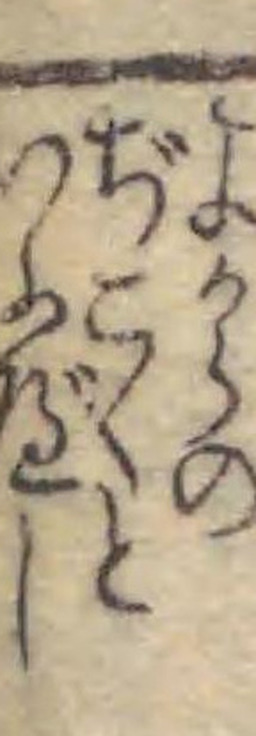いふべし
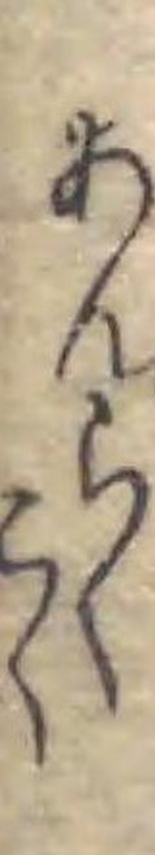あんらく
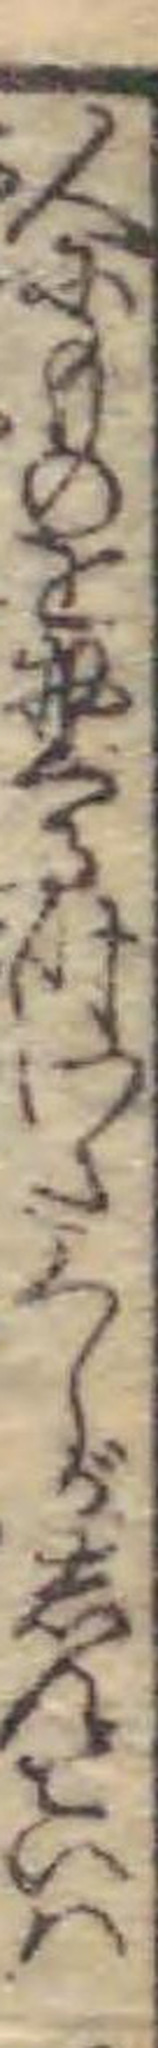人にものをおくる時わたくしがしんていは
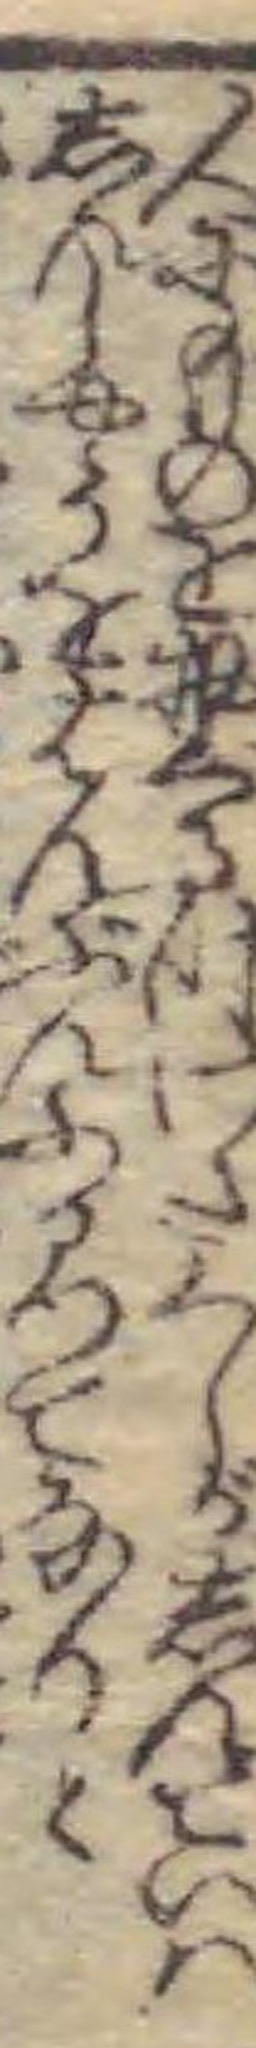しんしやうをはんぶんふるつてなりと
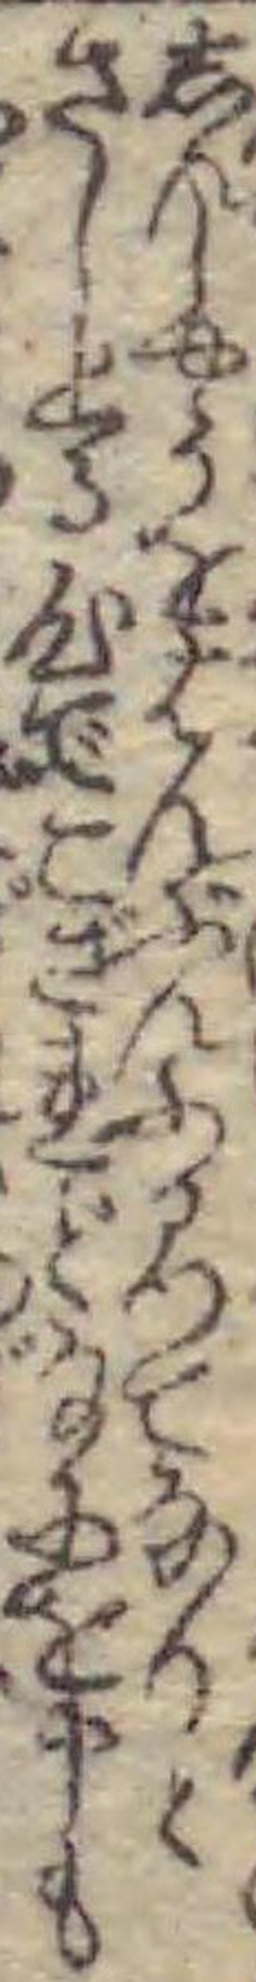さし上る心でこざれどなにを申も
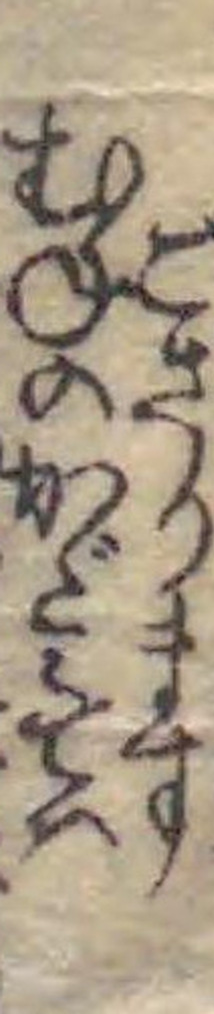むねのかゞみては
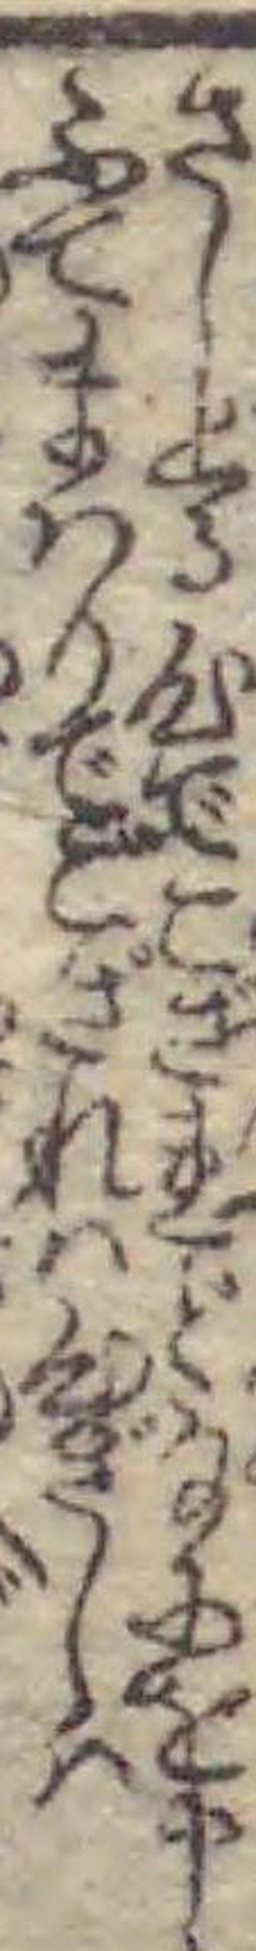ふてまはりでござれは心ざしは
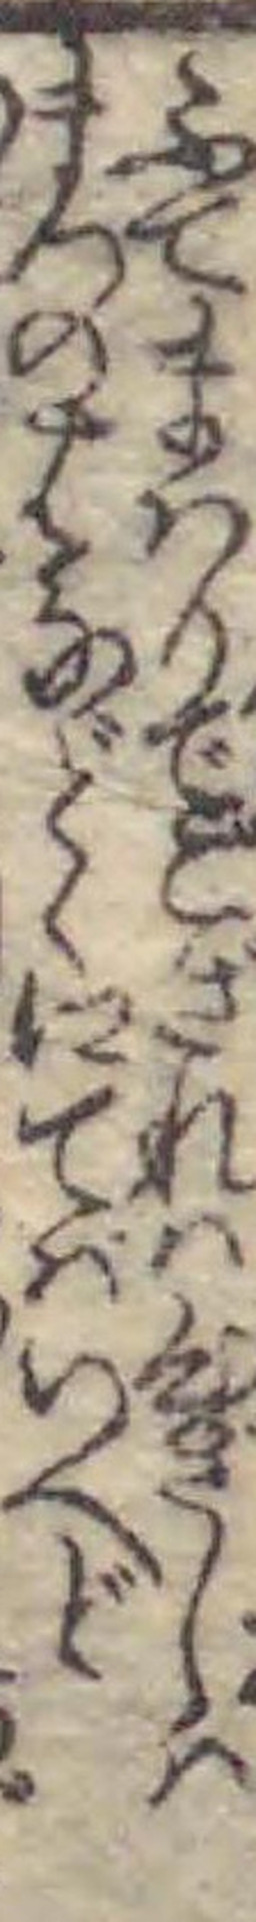まつのはなどゝ口てはいへど
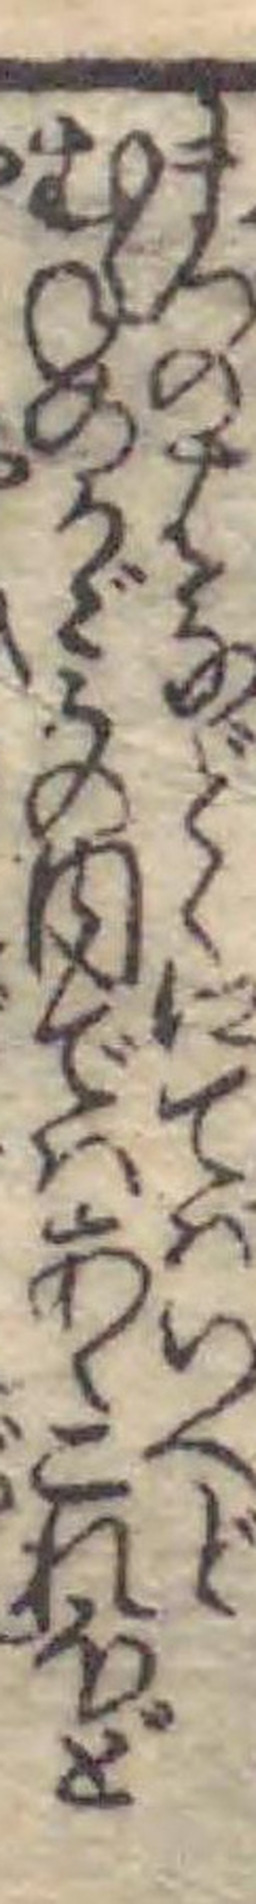むねのかゞみの内ではアヽこれほど
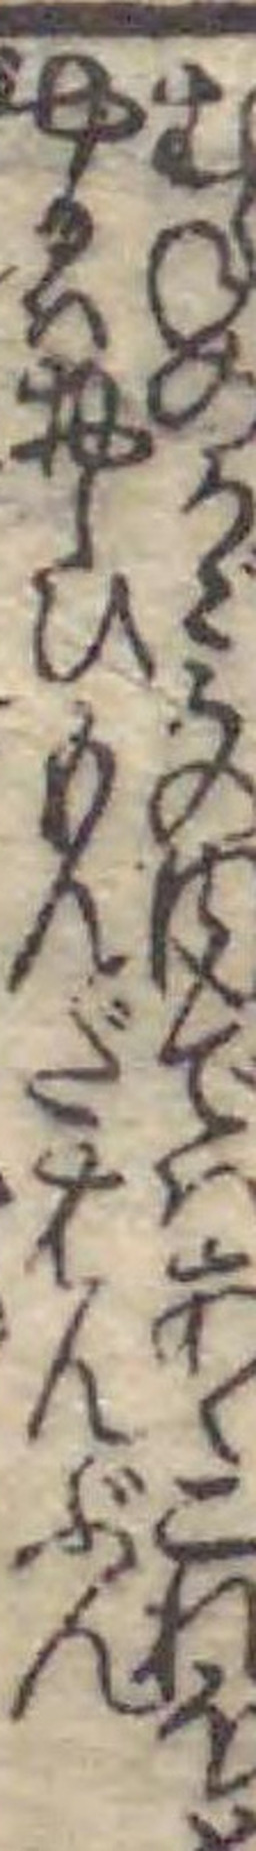やるはおしひもんだはんぶん
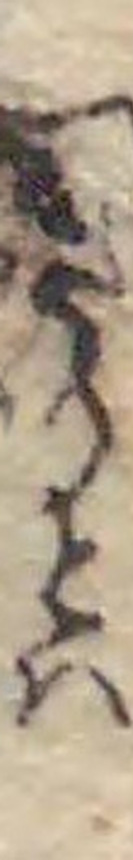〽さりとは
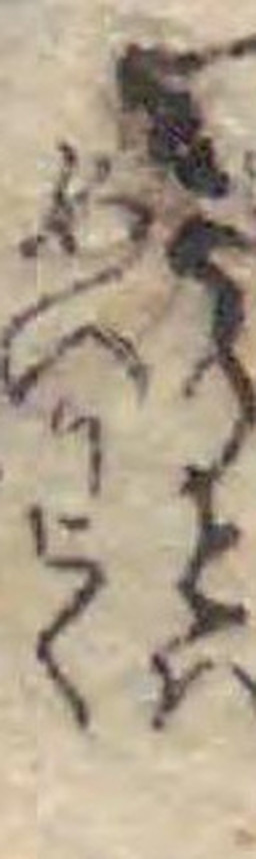めいわく
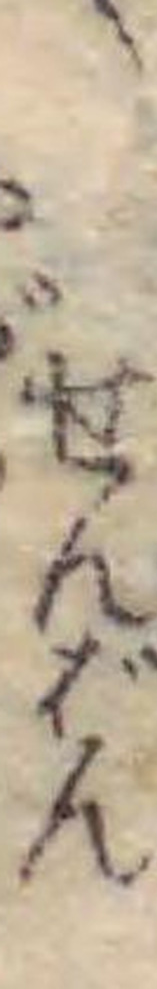せんばん
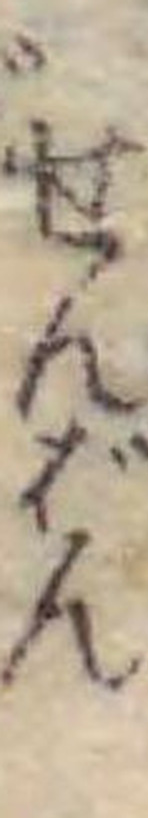せんばん
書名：人心鏡写絵 : 3巻
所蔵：国立国会図書館 National Diet Library, JAPAN
